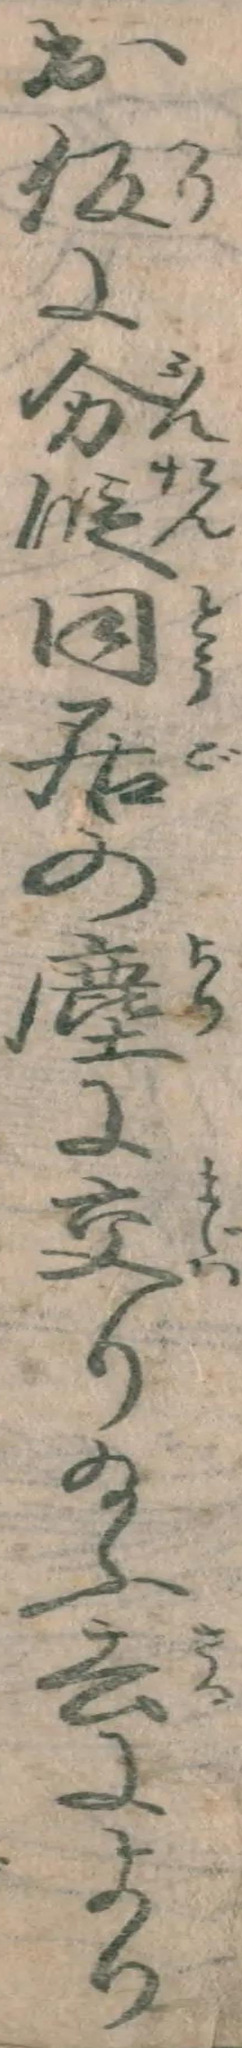出仮に分断同居の塵に交り給ふ去により
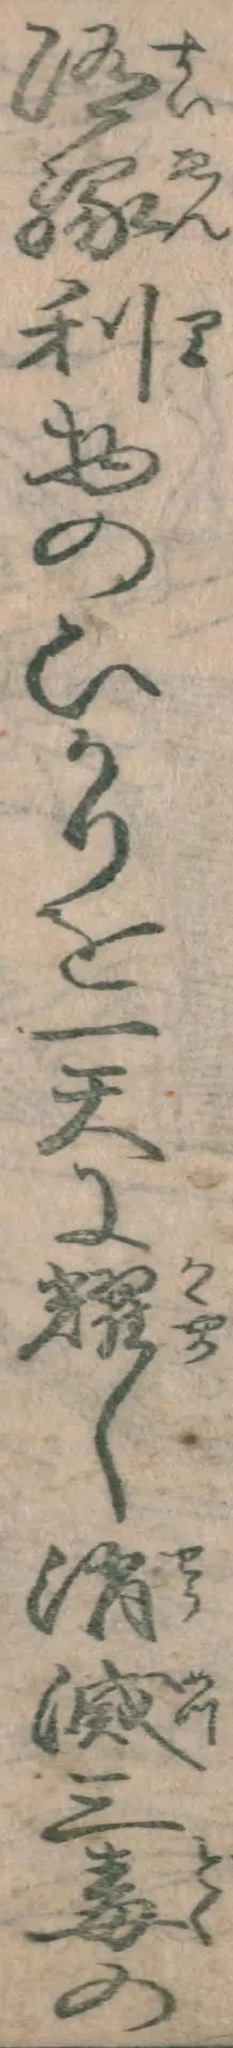隨縁利物のひかりを一天に輝し消滅三毒の
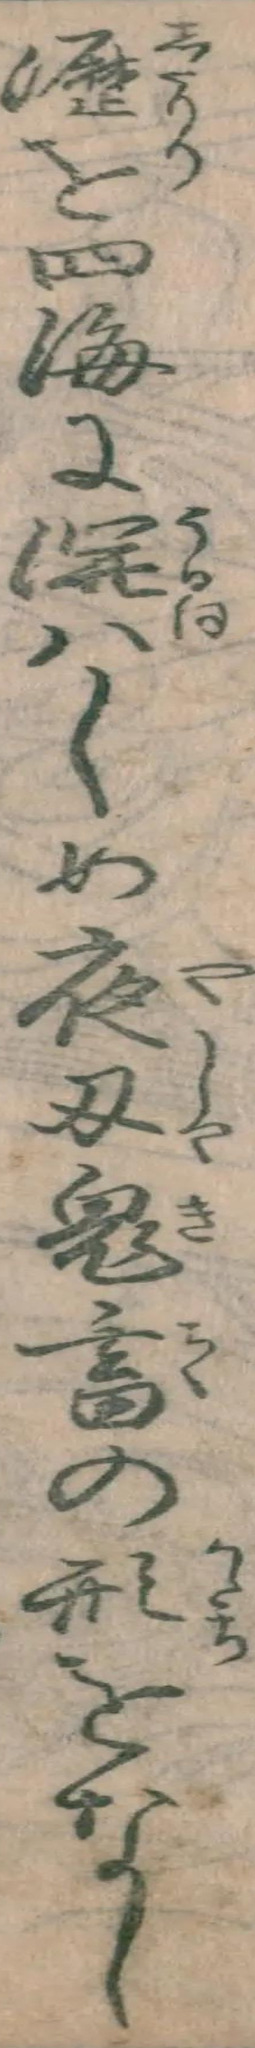瀝を四海に潤はしめ夜刃鬼畜の形をなし
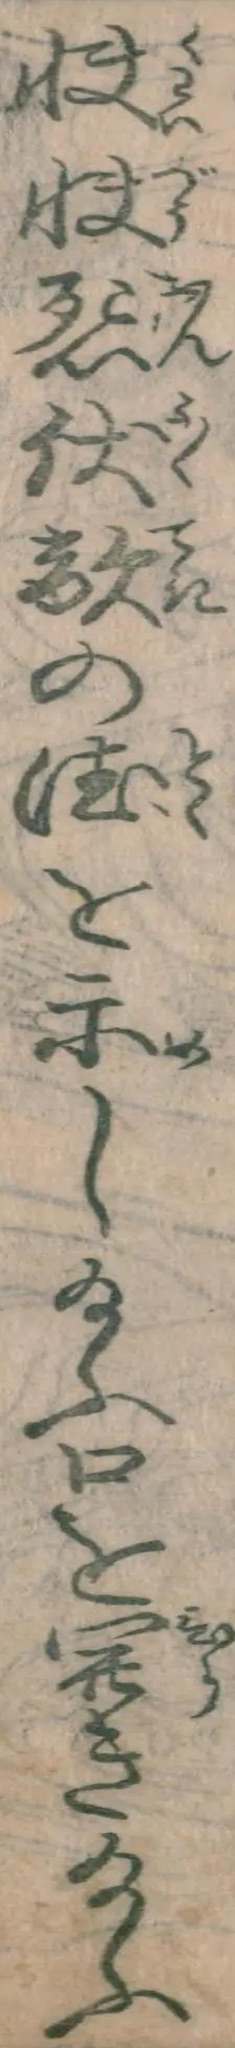快快怨伏敵の徳を示し給ふ口を開き給ふ
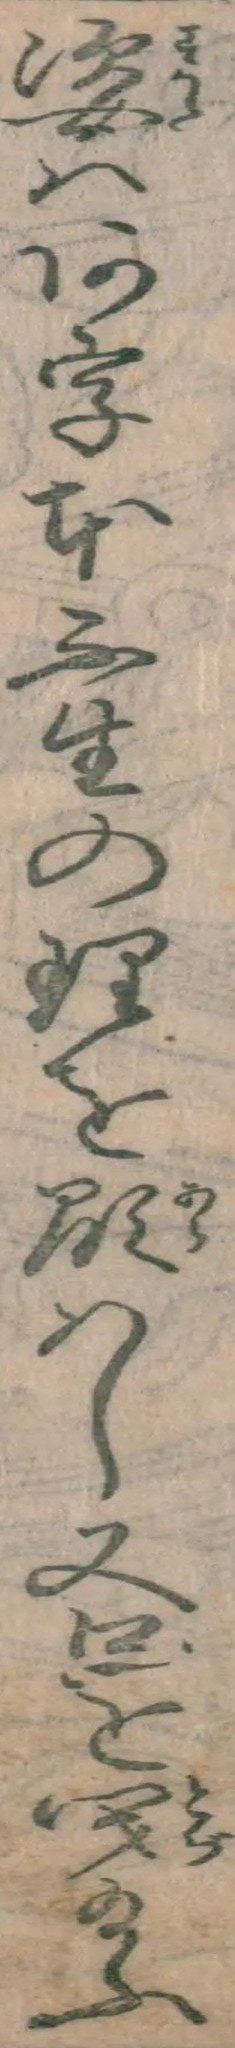姿は阿字本不生の理を顕はし又口を閉給ふ
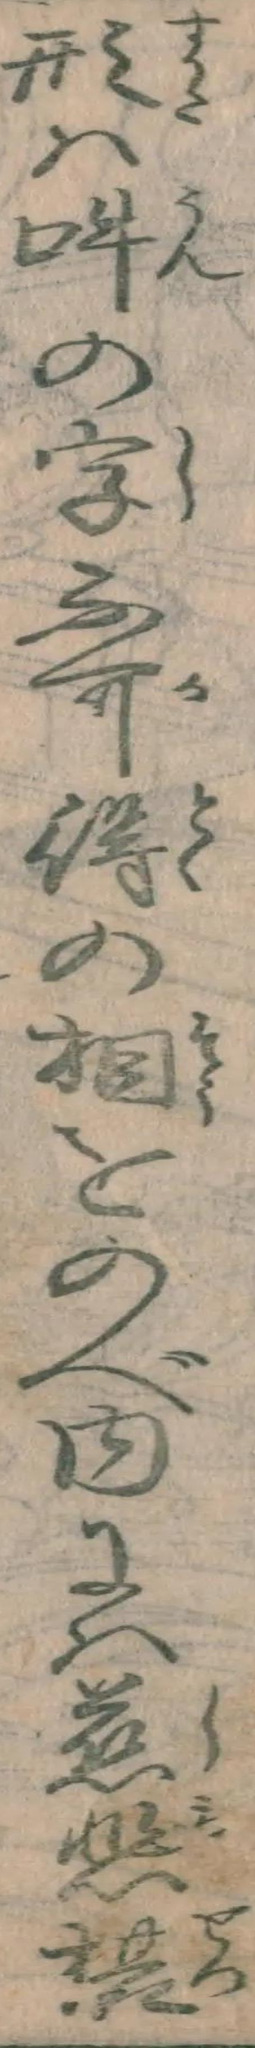形は吽の字不可得の相をのべ内には慈悲接
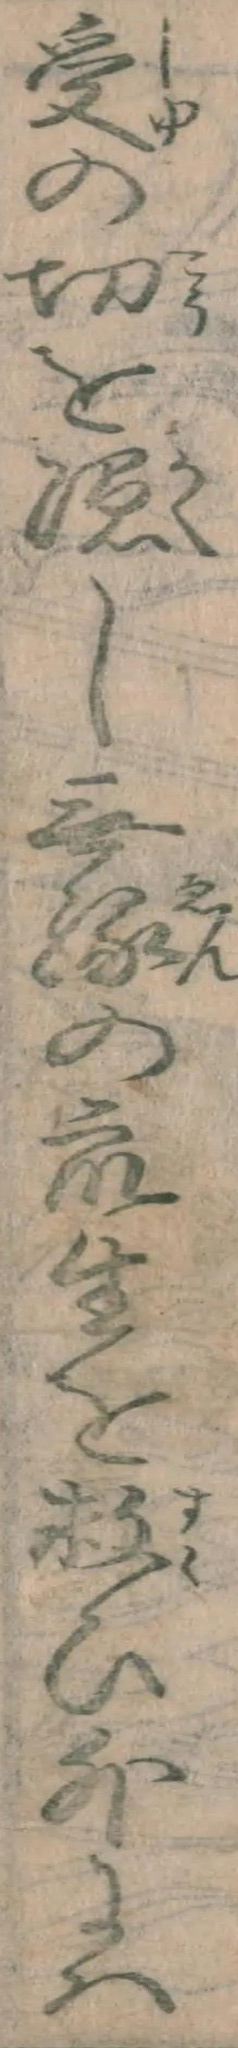受の功を隠し無縁の衆生を救ひ外には
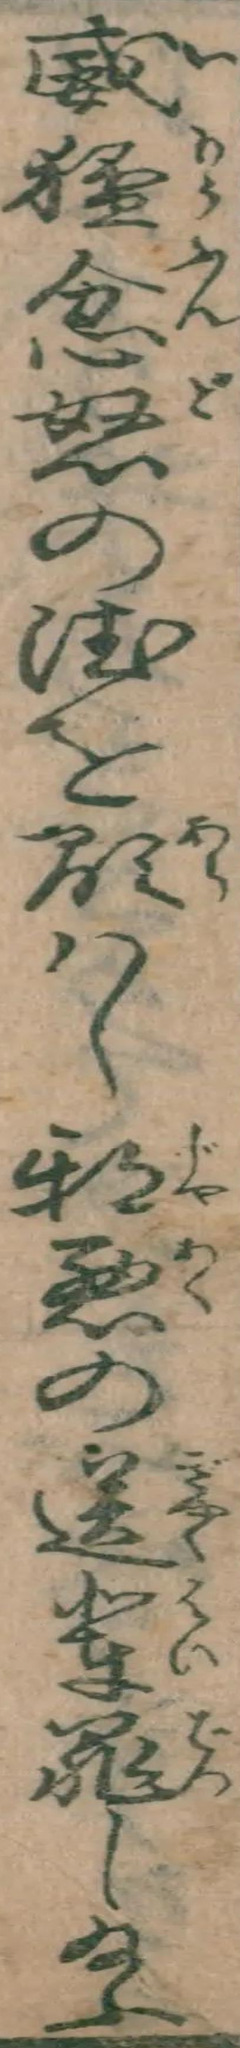威猛忿怒の徳を顕はし邪悪の送輩罰し給ふ
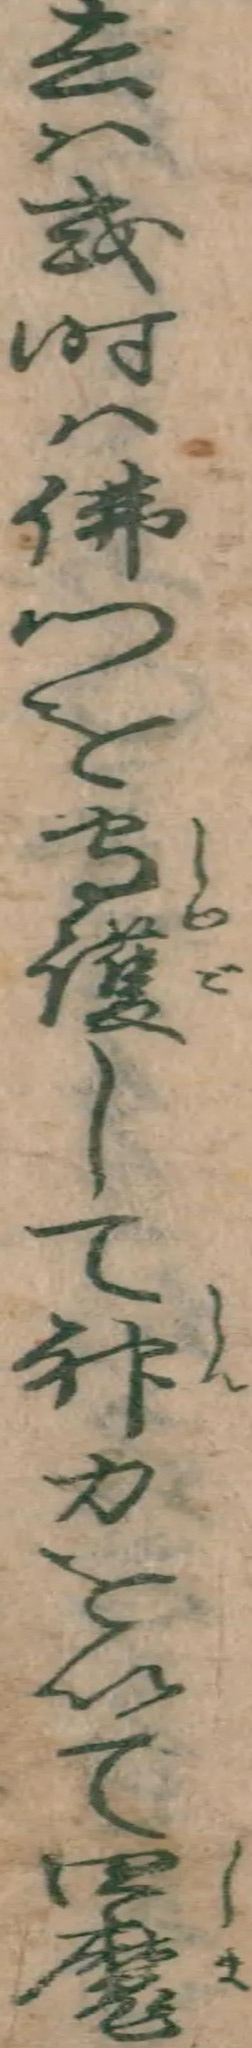去は或時は仏門を守護して神力を以て四魔
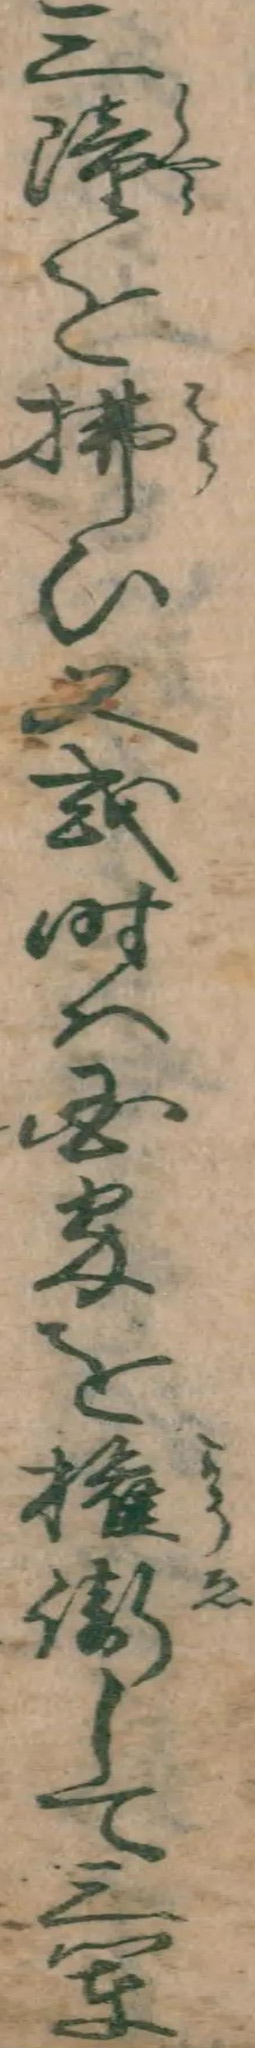三障を払ひ又或時は国家を権衛して三軍
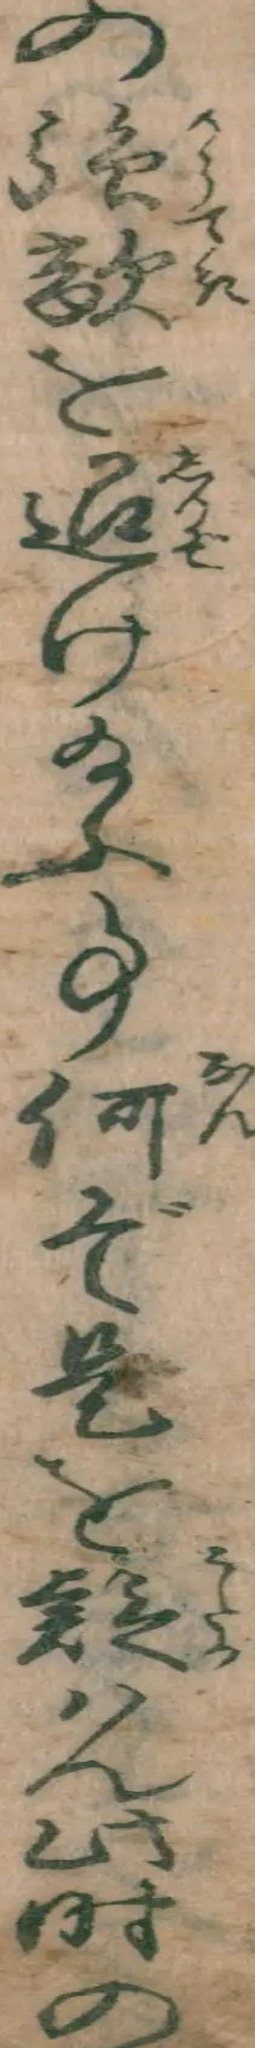の強敵を退け給ふ事何ぞ是を疑はん此時の
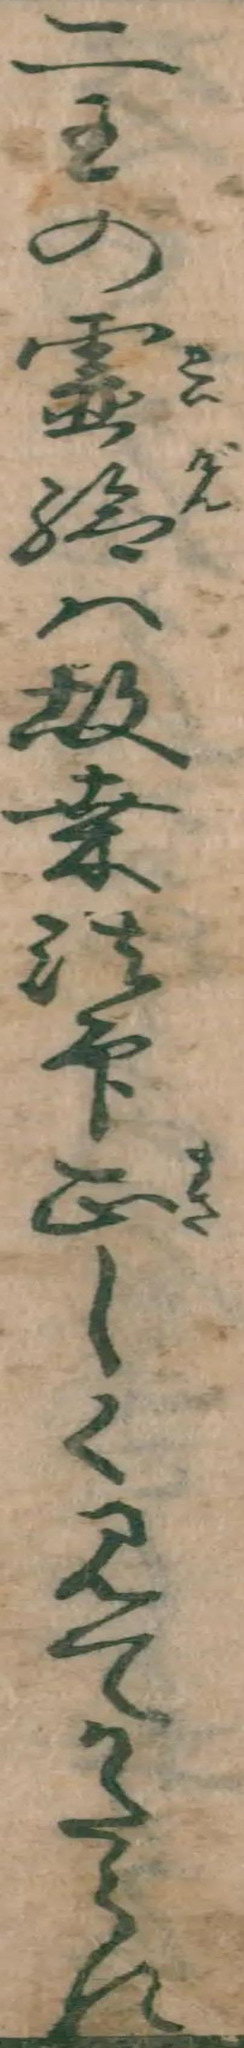二王の霊験は故桑法印正しく見てかたられ
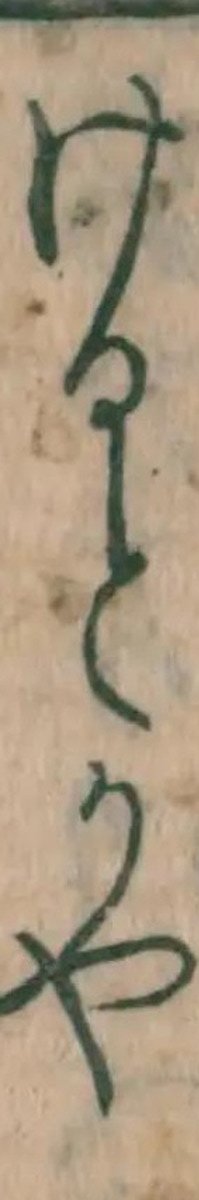けるとかや
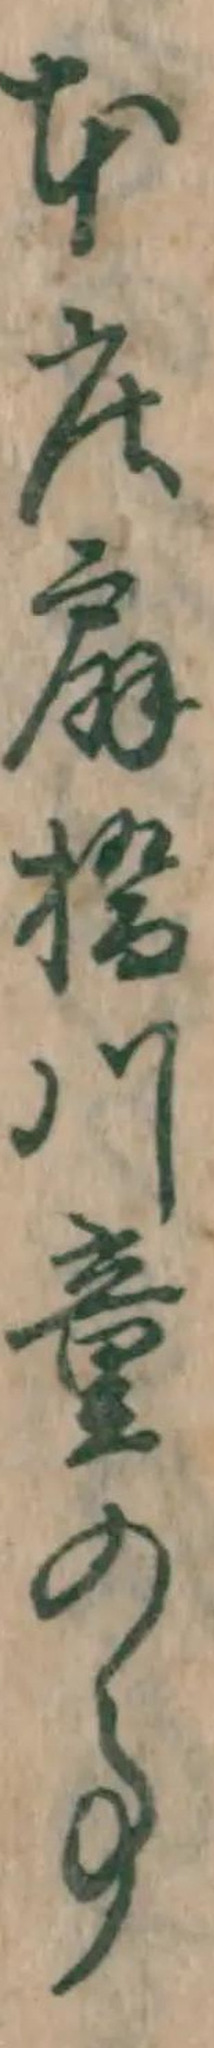本庄扇橋川童の事
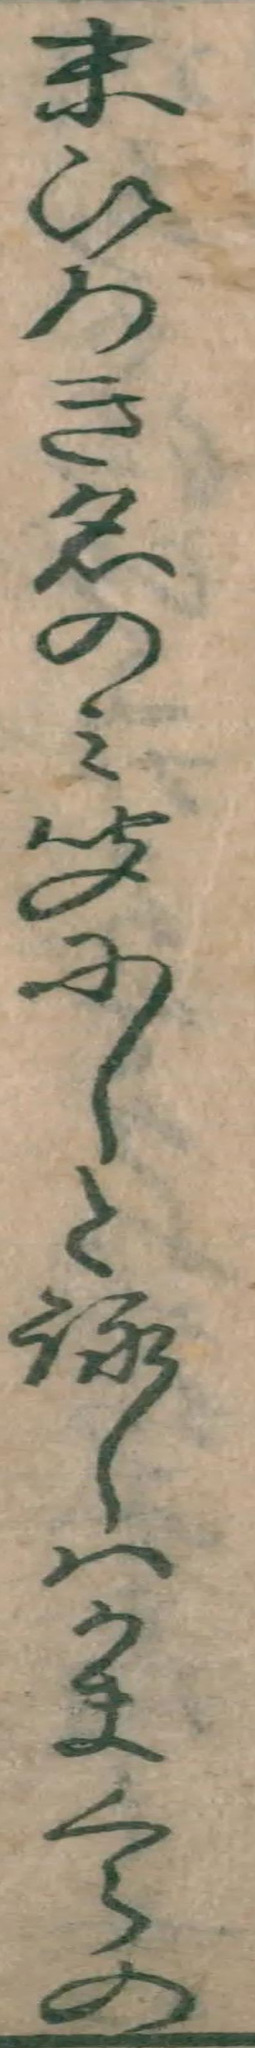末ひろき名のみ聞にしと詠しはかまくらの
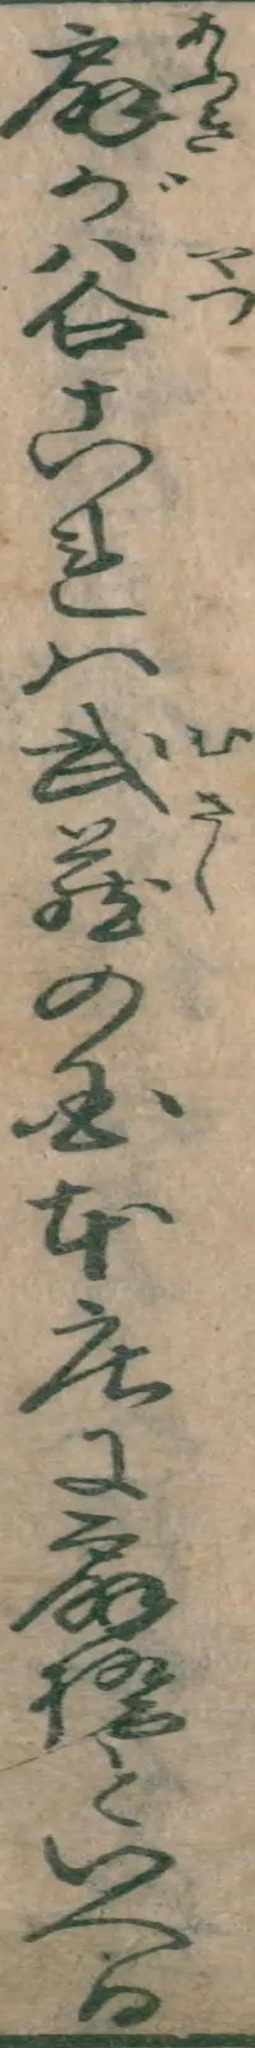扇が谷これは武蔵の国本庄に扇橋といへる
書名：怪談御伽童 5巻. [1]
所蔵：国立国会図書館 National Diet Library, JAPAN
